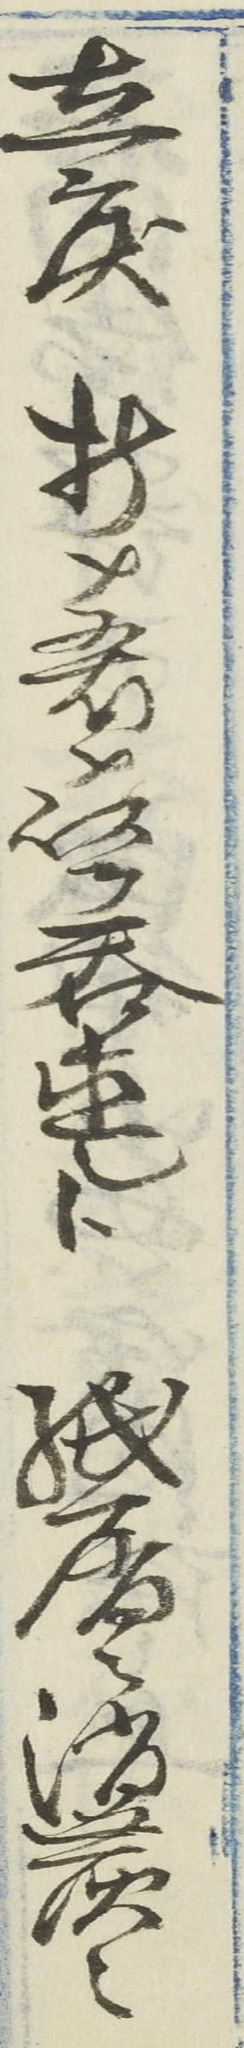立戻折ヲ肴ヲ以テ呑直シト紙屑ニ消炭之
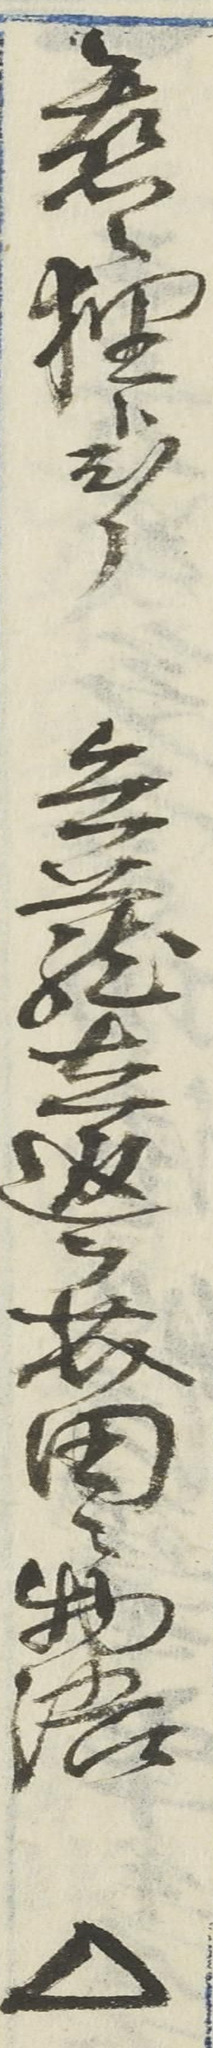哀狸ト云う兵蔵立返テ芥田ニ物語
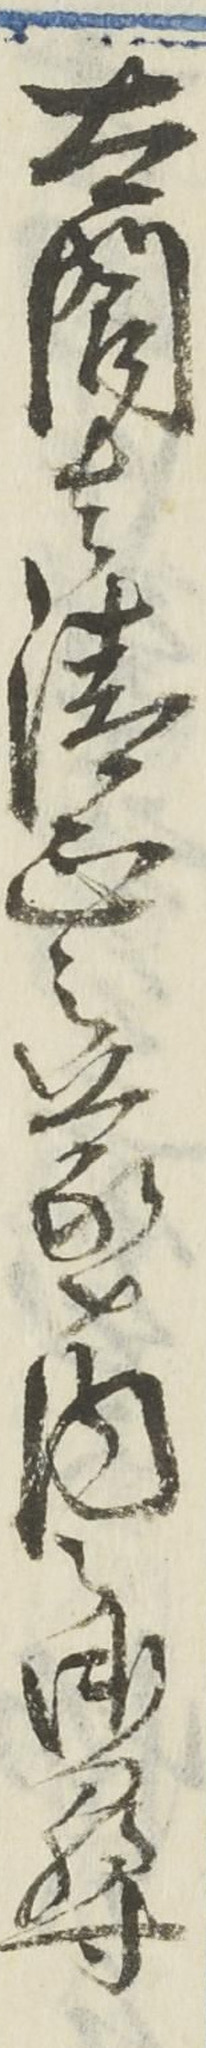太閤は清正之義ヲ内々御尋
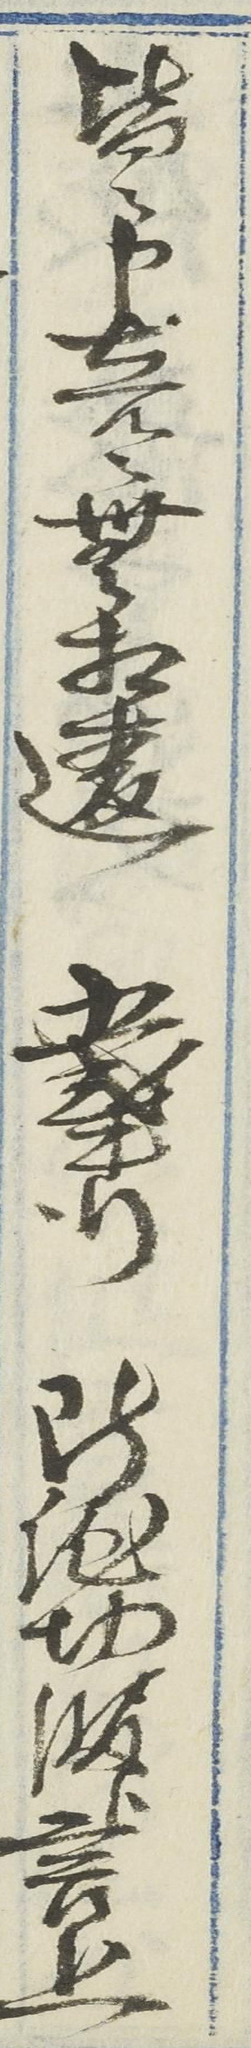皆々申立ルニ無相違五奉行断絶切腹ト言上
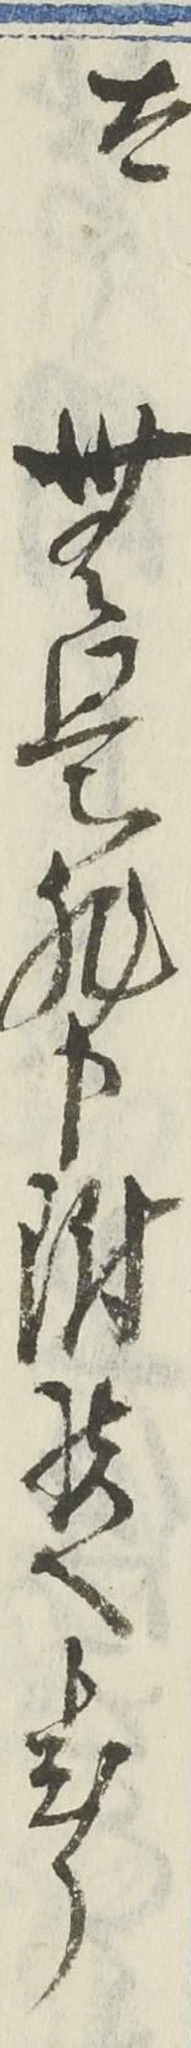太無是非申附候ヘト云う
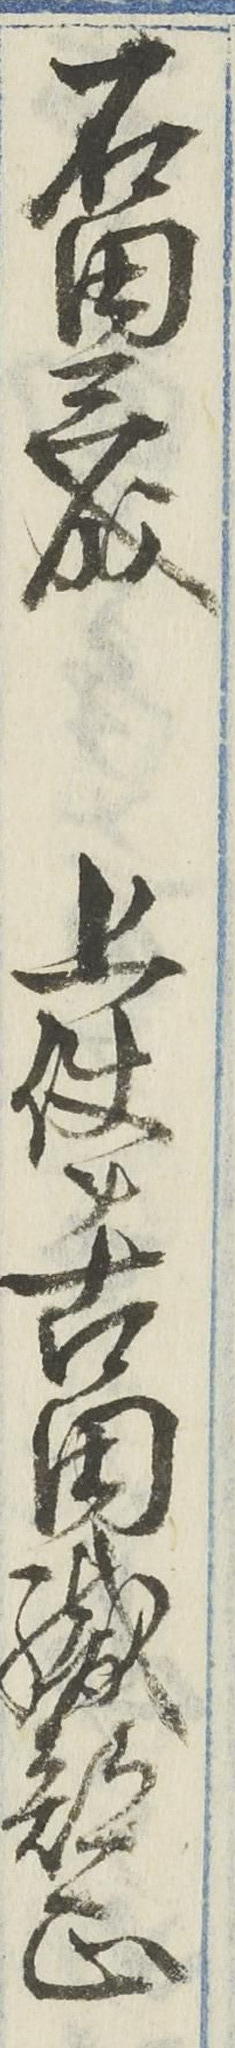石田三成上使ヲ古田織部正
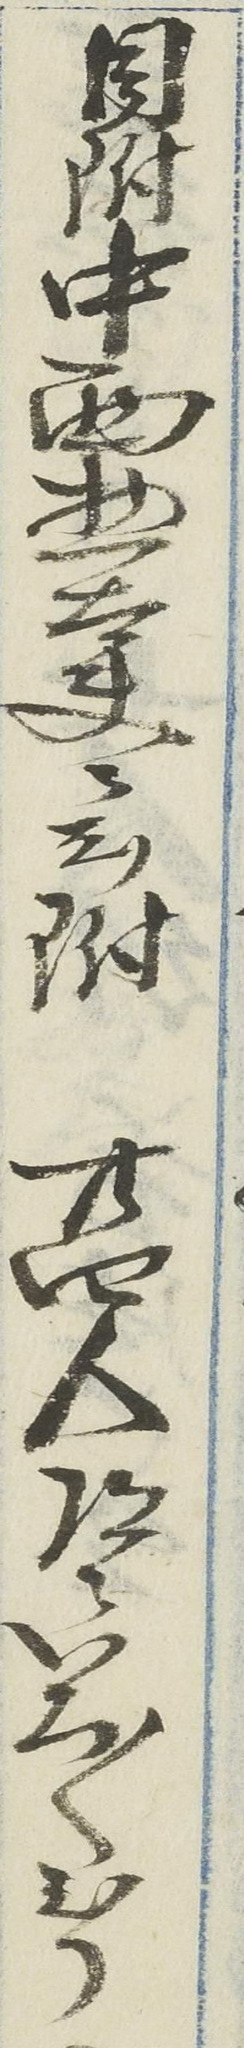目附中西惣太夫ニ云附廿四人道〻いろ〳〵云う
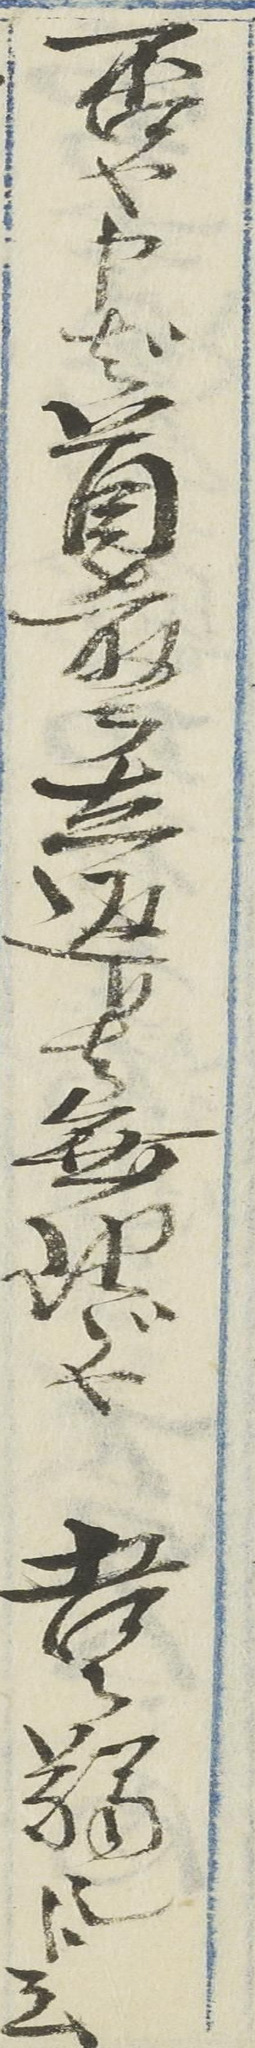否ヤ申バ首ヲ取テ立返りは無理じや吾之弱？シト云
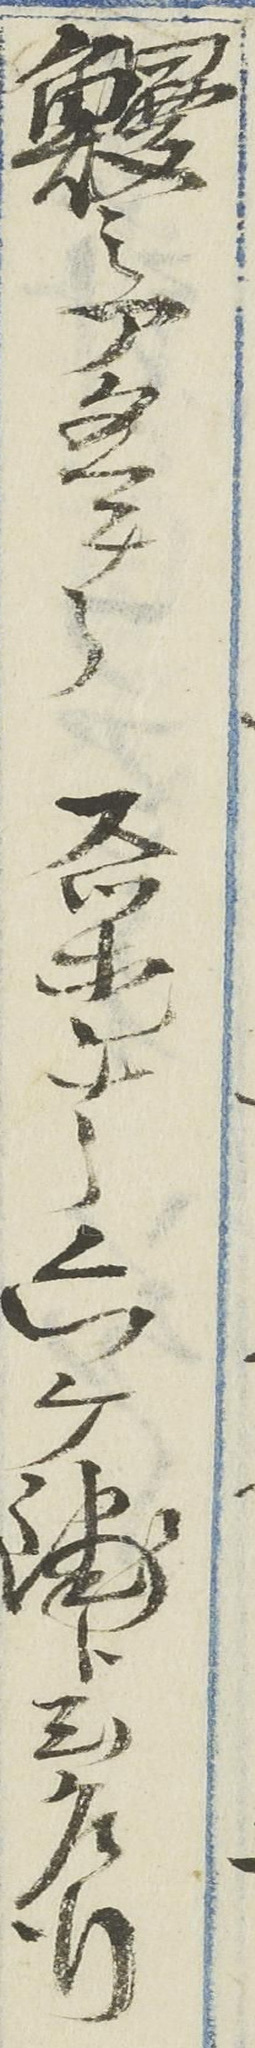鰻之アタマナラスツホンナラ六ヶ舗ト云乍行
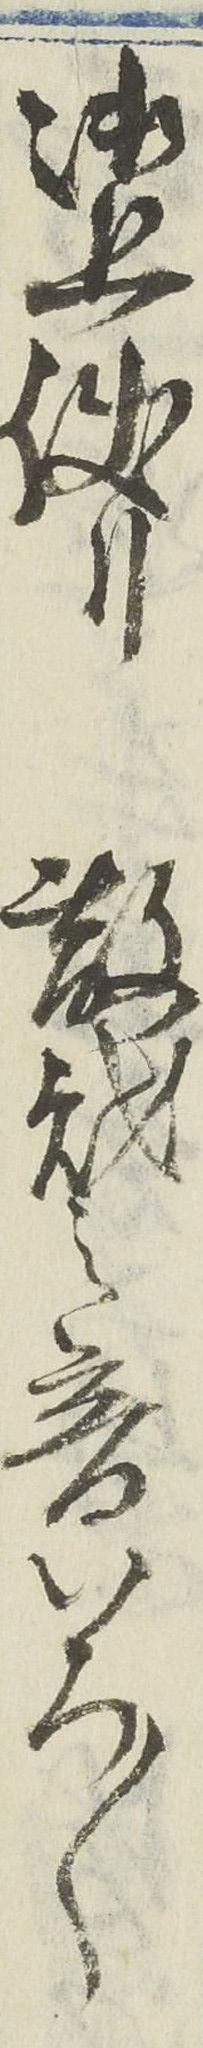御上使散財之音いろ〳〵

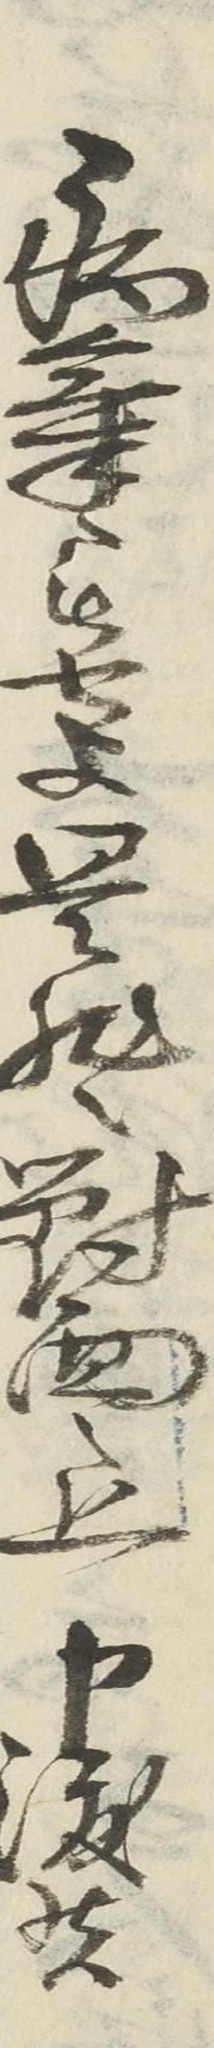両病気もせよ是心之対面之上申渡候
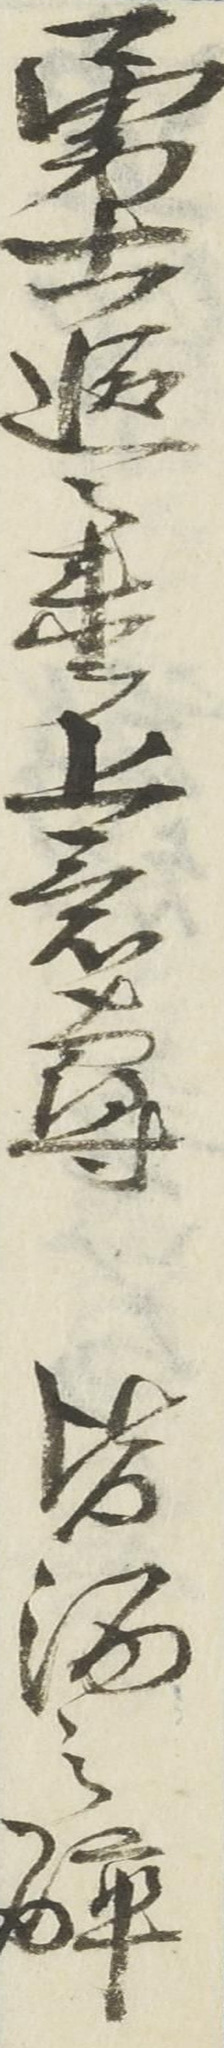勇士追々来ニ上意ヲ尋皆酒二醉
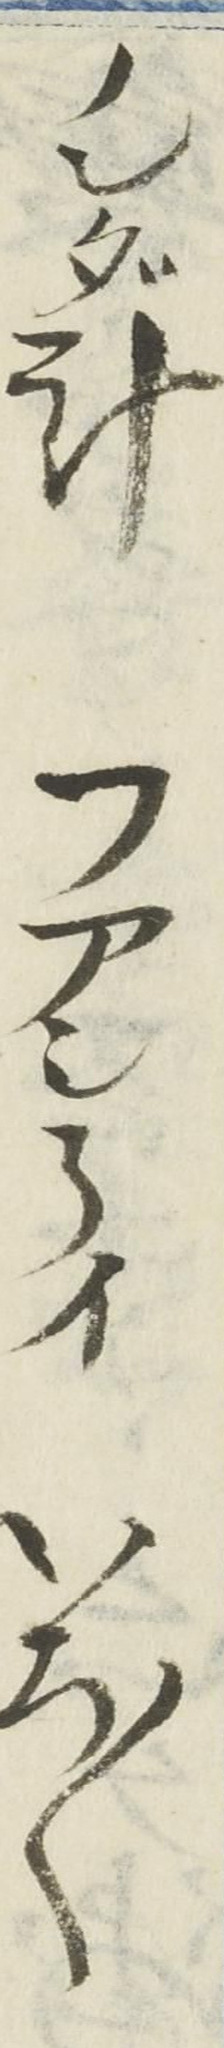ノンダ計フアンイいろ〳〵
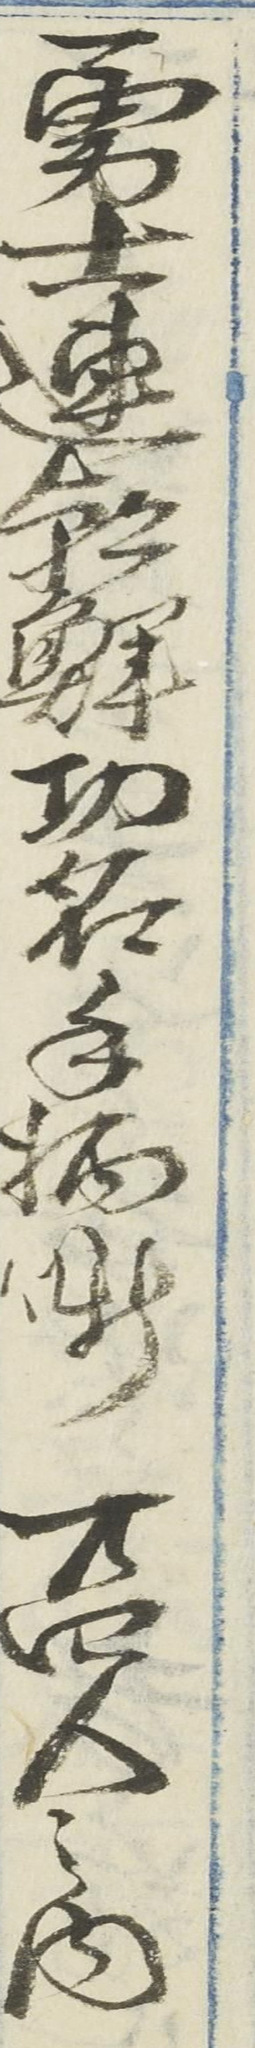勇士連朝鮮功名手柄噺廿四人之内
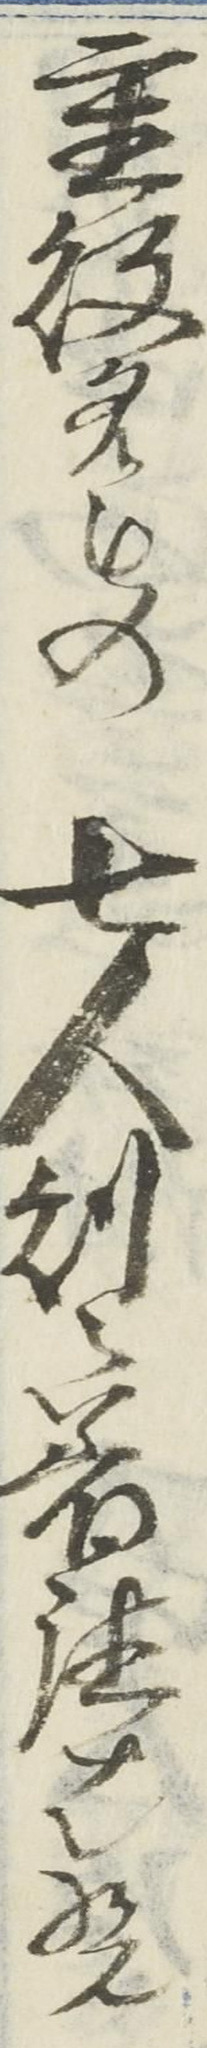重役タルもの七人則之着注ヲし有ル
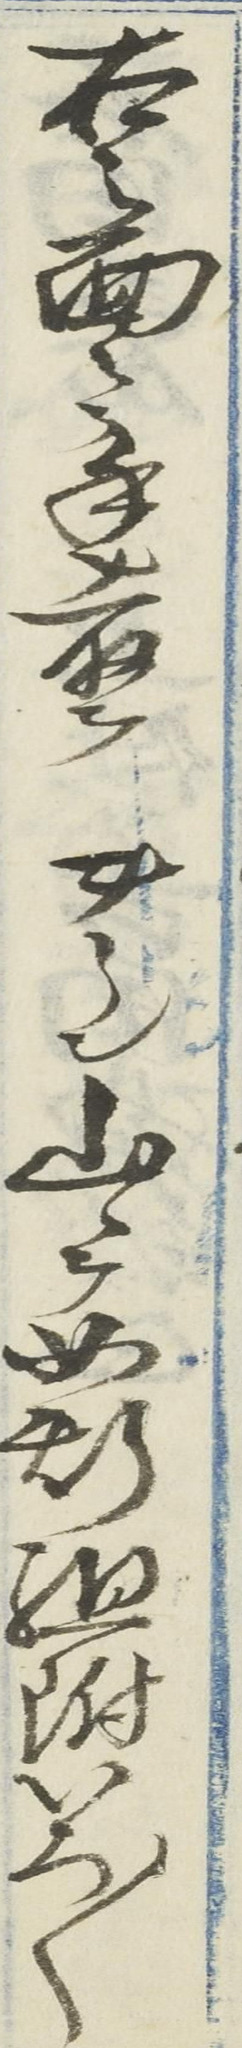右之面々手ヲ取テらし山々テ如斯組附いろ〳〵
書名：伏水大地震
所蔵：東京大学地震研究所図書室 Earthquake Research Institute Library, The University of Tokyo, JAPAN
